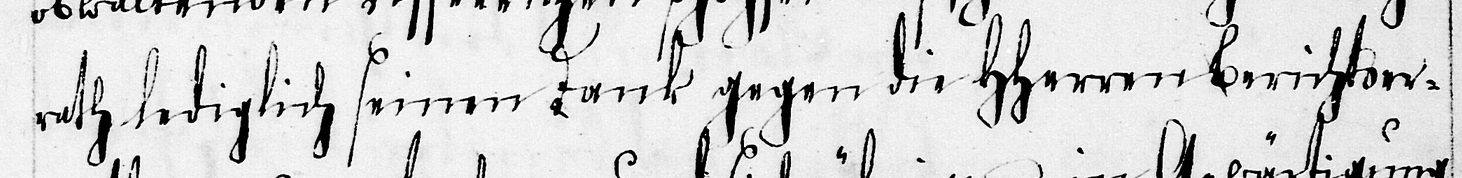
rath lediglich seinen Dank gegen die HHerren Berichtser¬
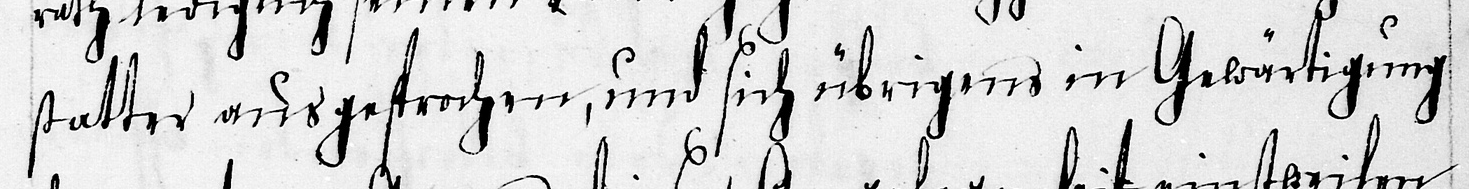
statter ausgesprochen, und sich übrigens in Gewärtigung
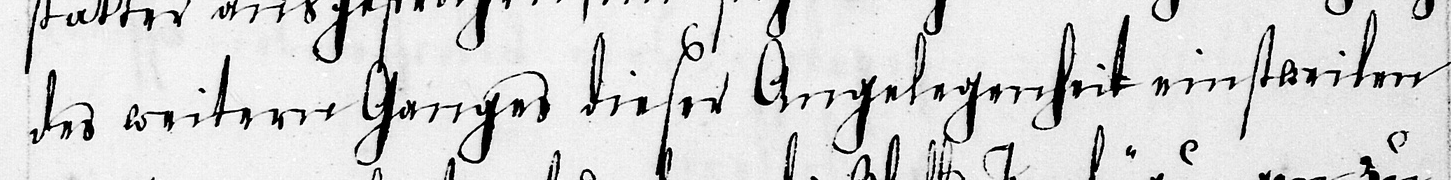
des weitern Ganges dieser Angelegenheit einstweilen
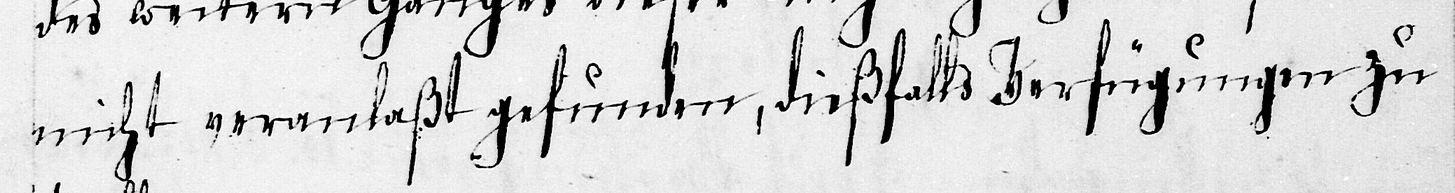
nicht veranlaßt gefunden, dießfalls Verfügungen zu
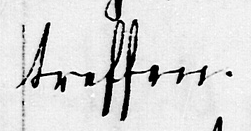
treffen.
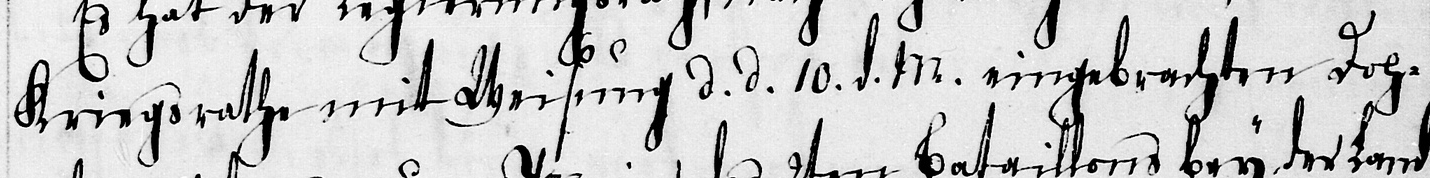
Kriegsrathe mit Weisung d. d. 10. d. M. eingebrachten Dop¬
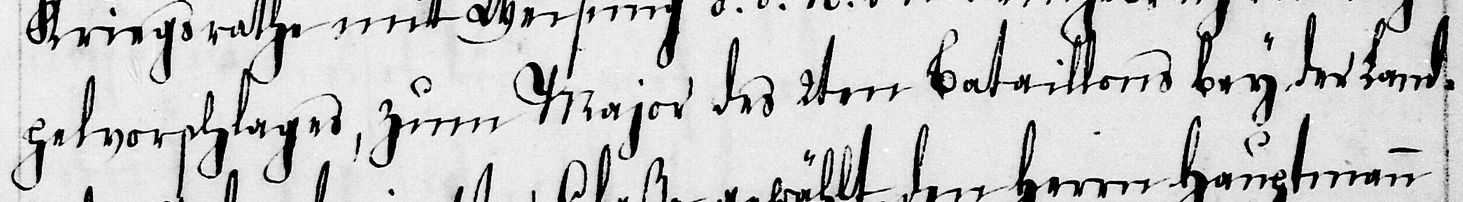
pelvorschlages, zum Major des 2ten Bataillons bey der Land¬
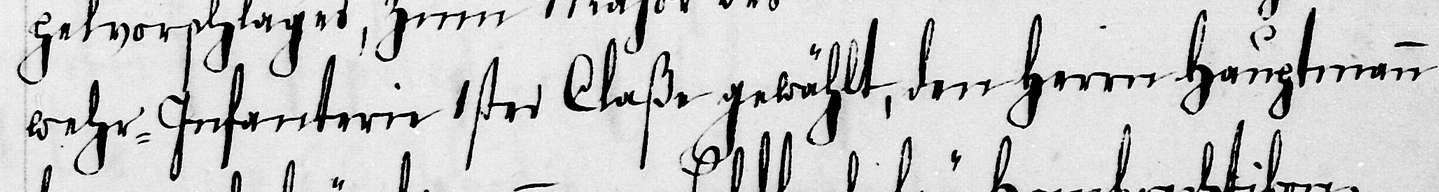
wehr-Infanterie 1ster Claße gewählt, den Herrn Hauptmann
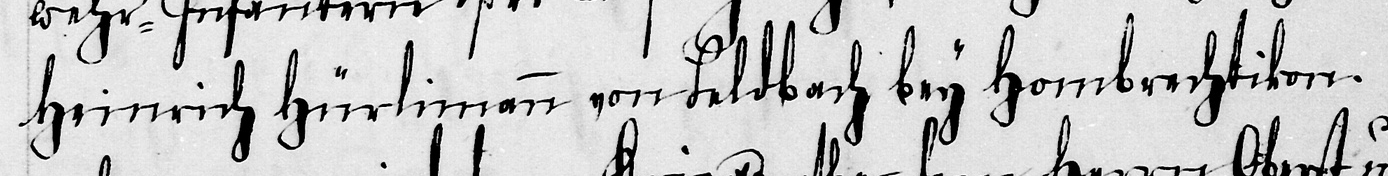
Heinrich Hürlimann von Feldbach bey Hombrechtikon.
